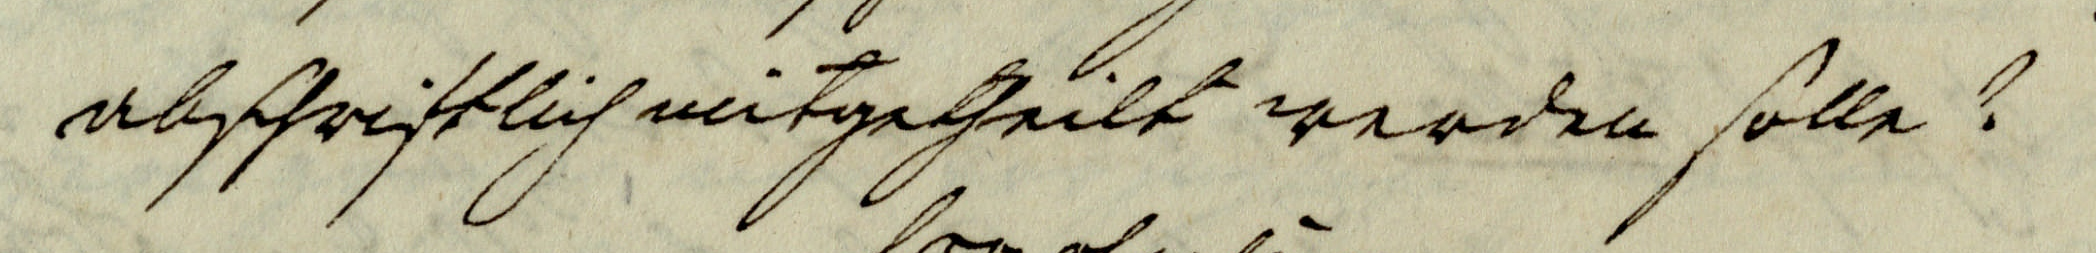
abschriftlich mitgetheilt werden solle?
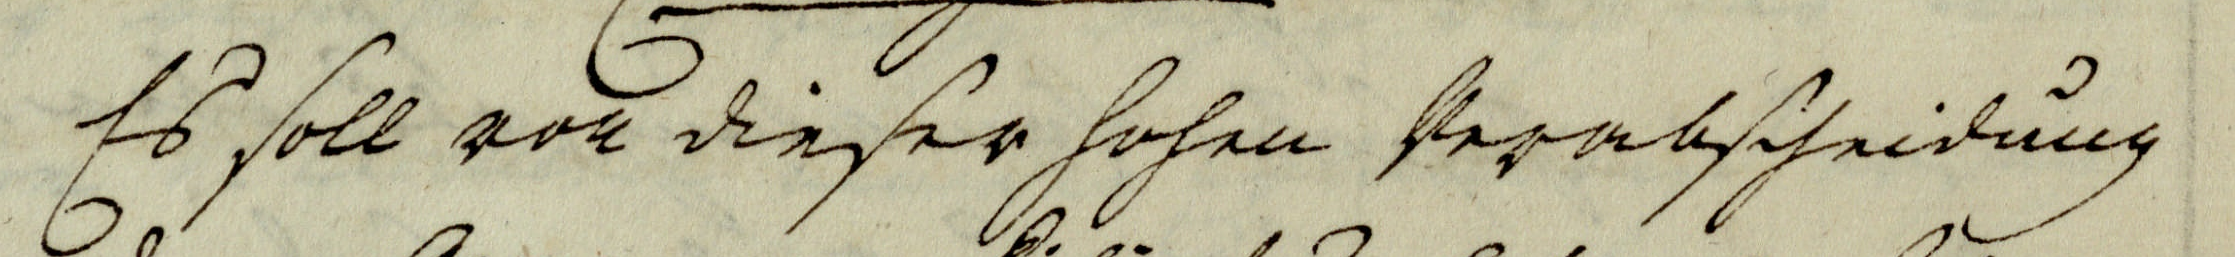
Es soll von dieser hohen Verabscheidung
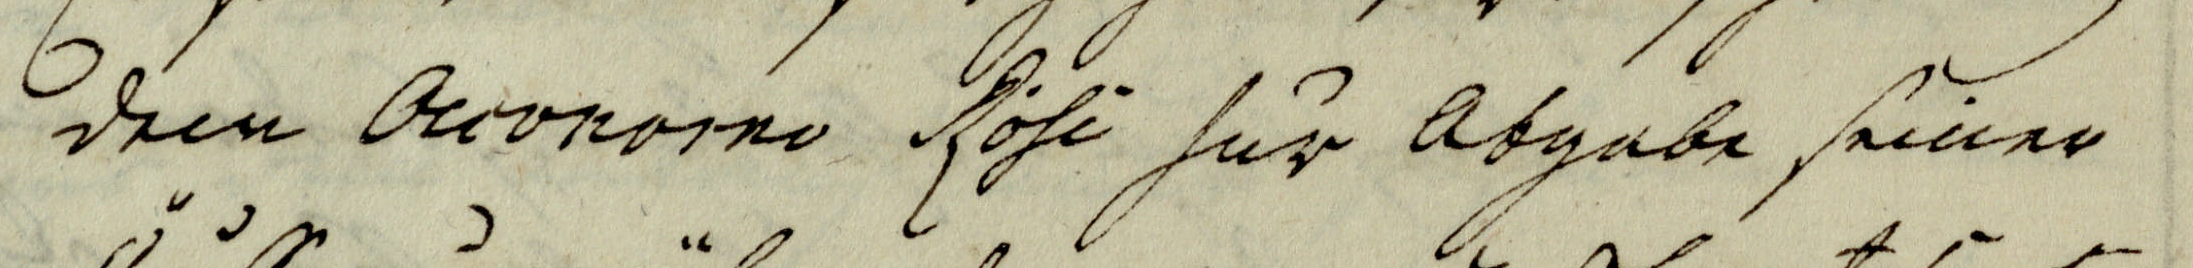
dem Oeconomo hohe zur Abgabe seiner
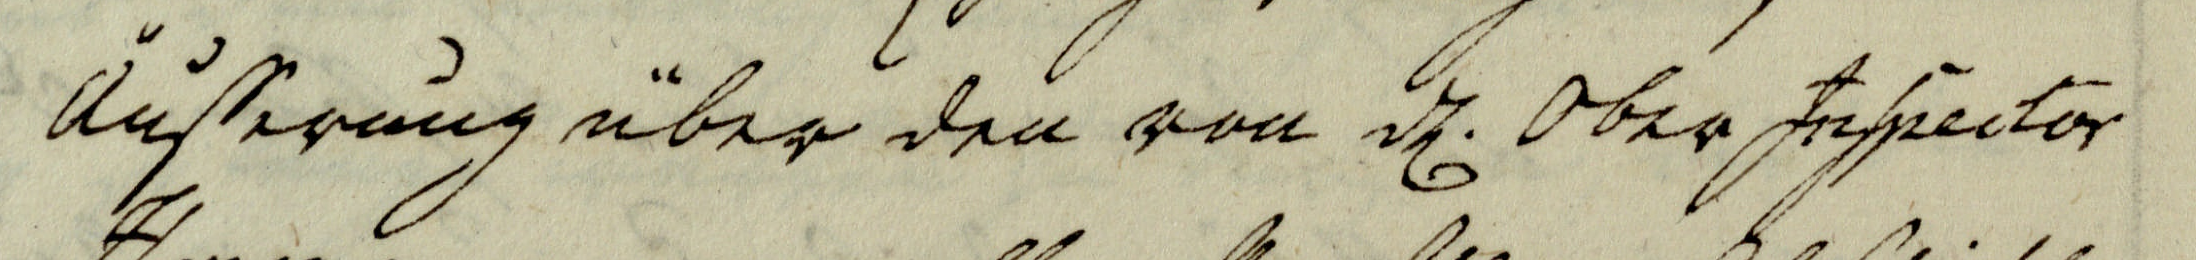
Äusserung über den von dh. Ober Inspector
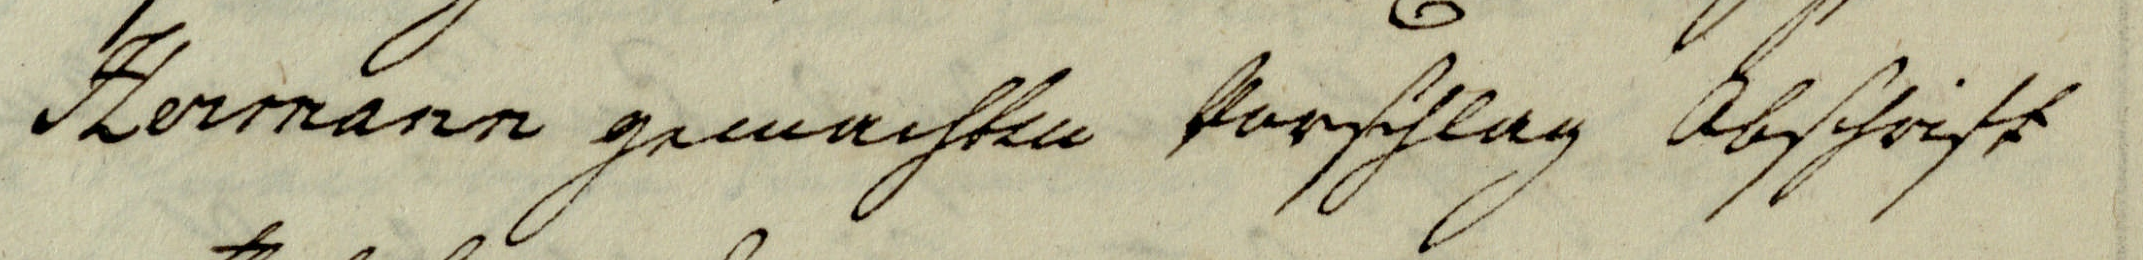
Hermann gemachten Vorschlag Abschrift
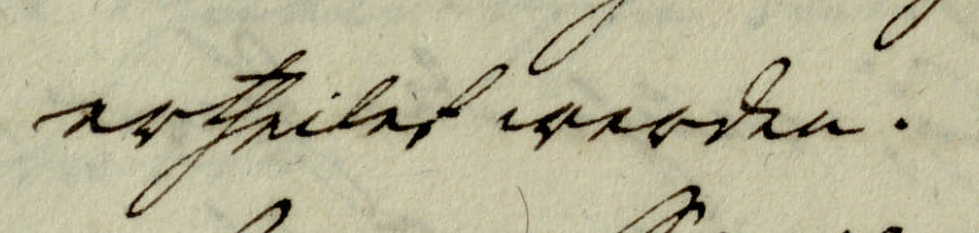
ertheilet werden.
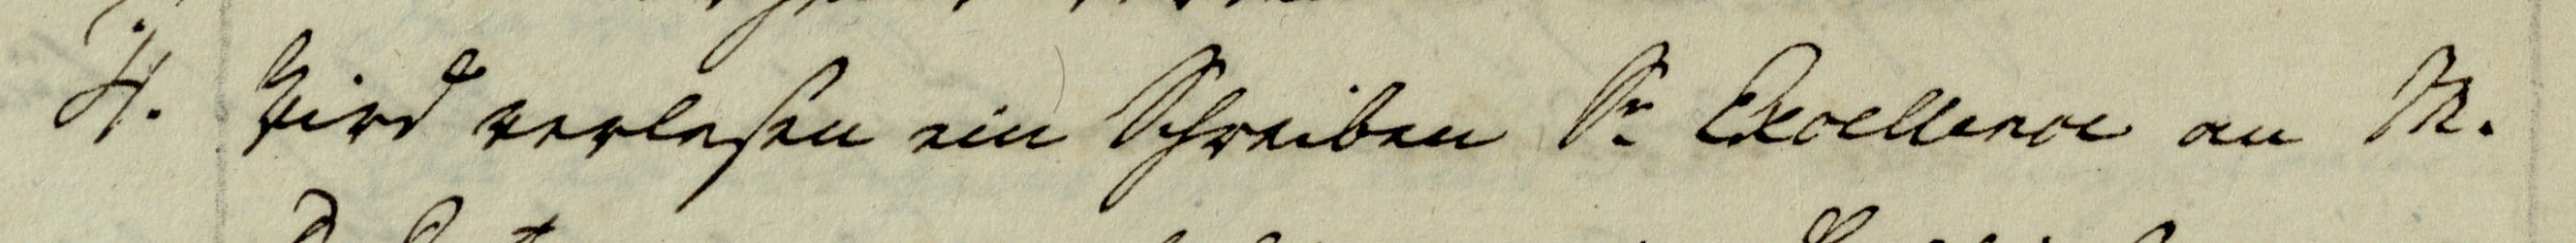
4. Wird verlesen ein Schreiben Sr Excellence an M.
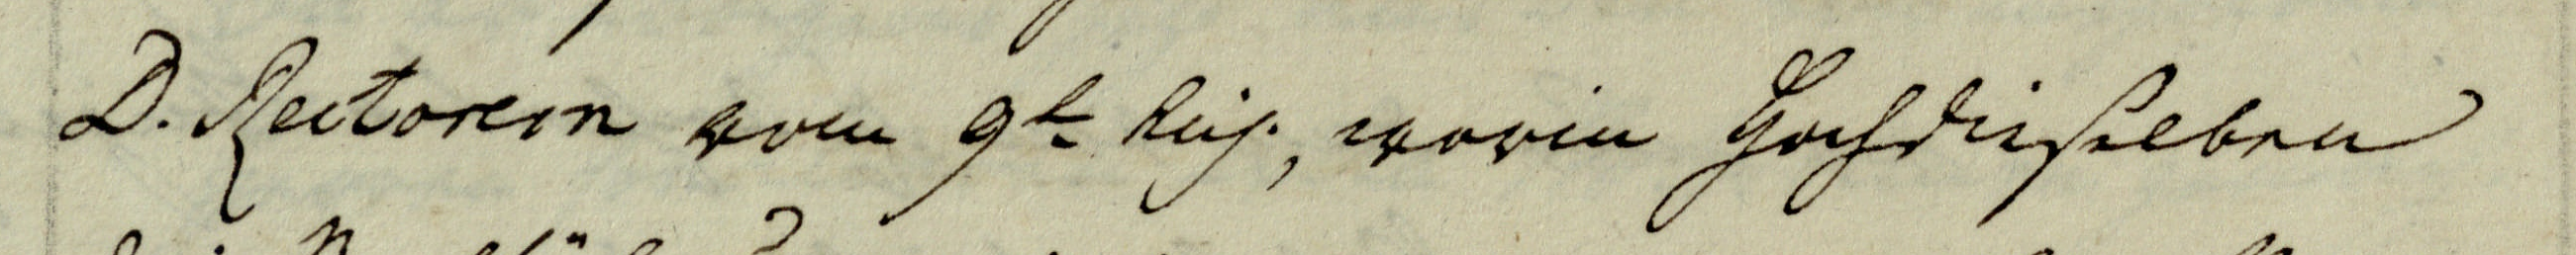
D. Rectorem vom 9 ten huj., worin Hochdieselben
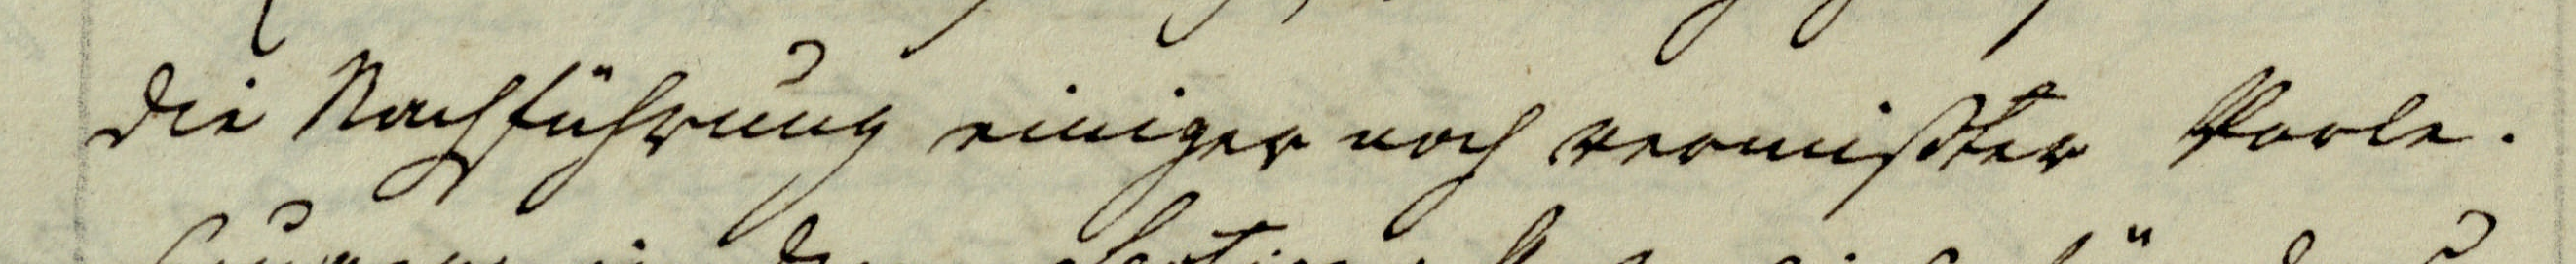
die Nachführung einiger noch vermißter Vorle¬
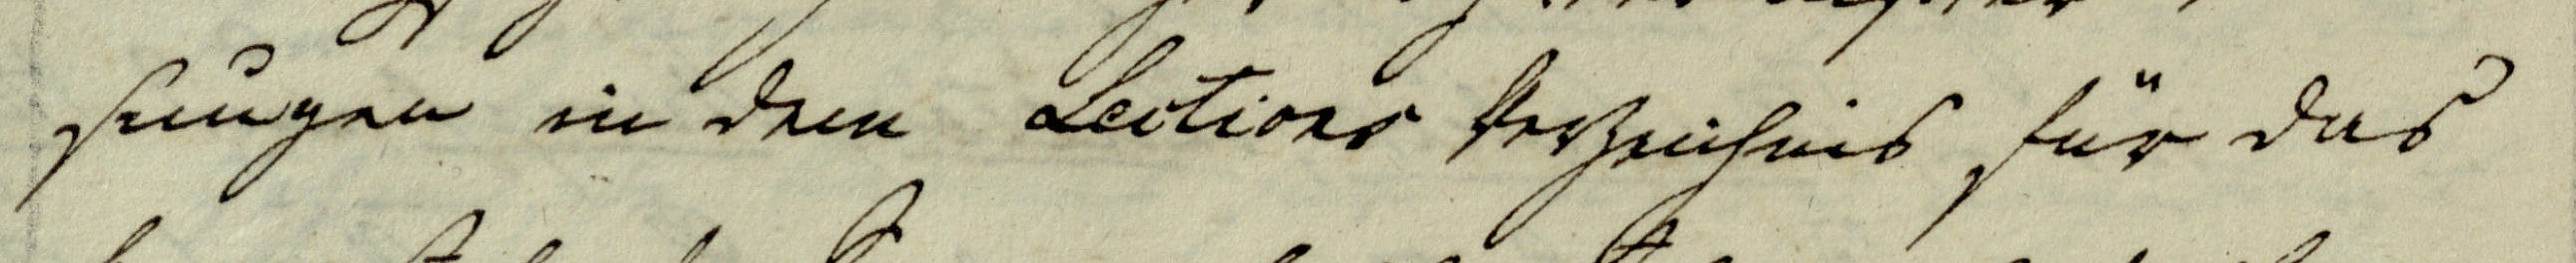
sungen in dem Lections Verzeichnis für das
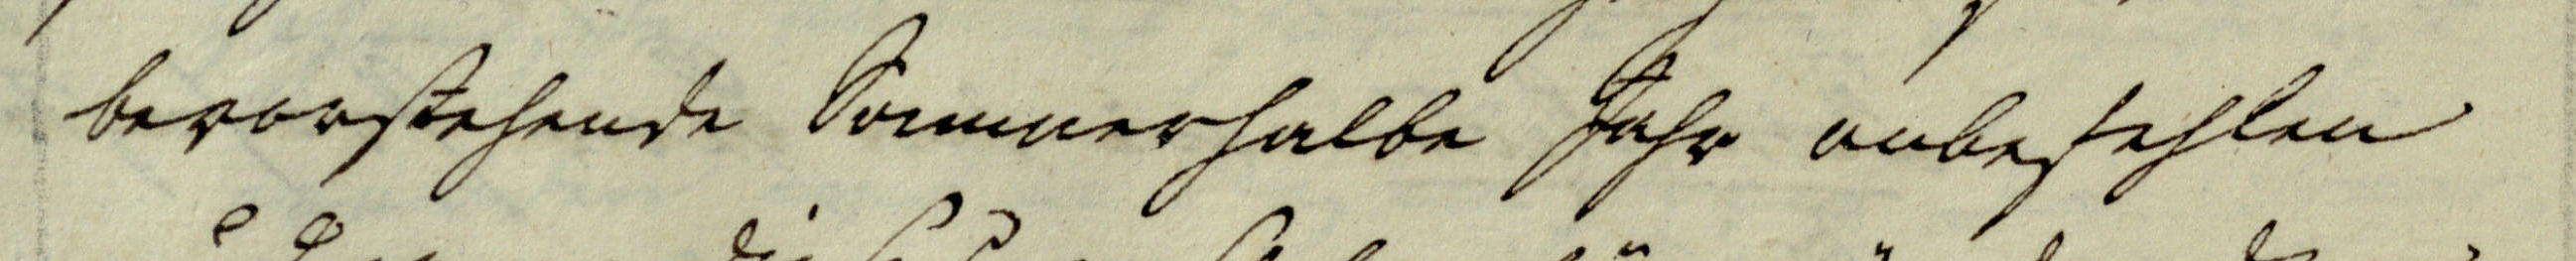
bevorstehende Sommerhalbe Jahr anbefehlen
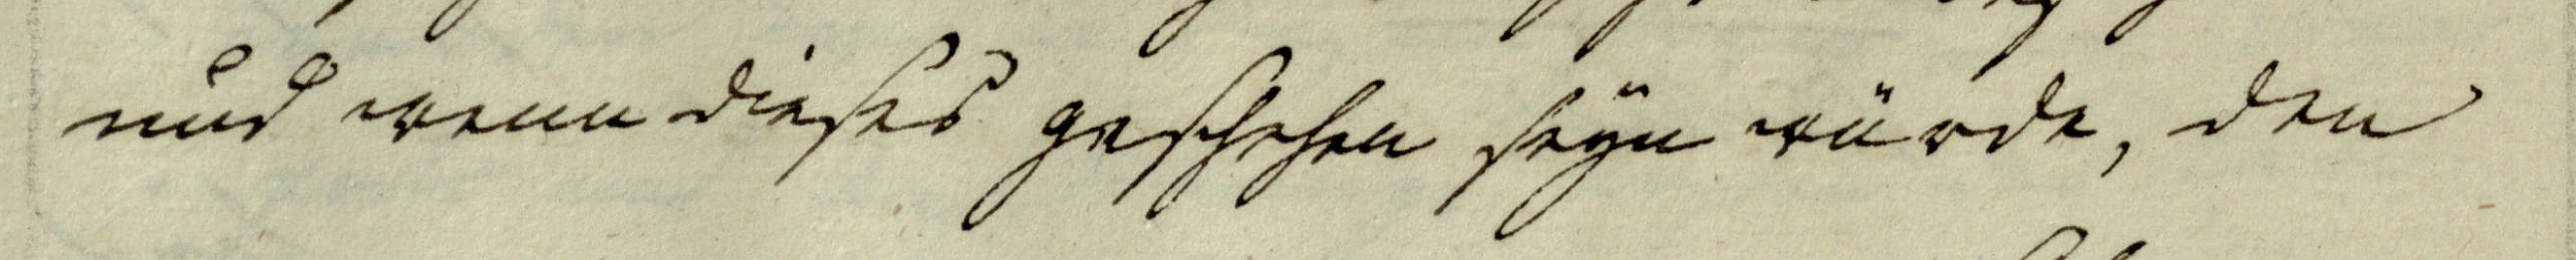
und wenn dieses geschehen seÿn würde, den
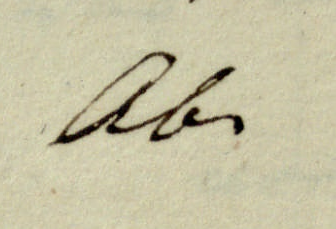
Ab¬
